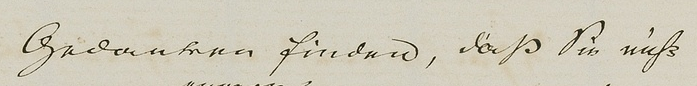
Gedanken finden, daß Sie nicht
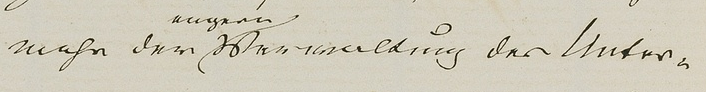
mehr der engern Verwaltung des Unter-
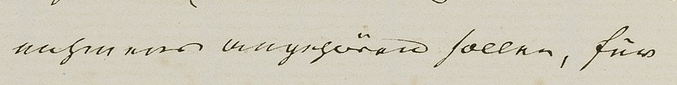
nehmens angehören sollen, für
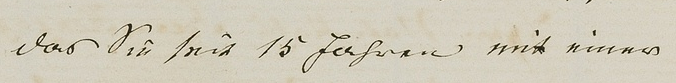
das Sie seit 15 Jahren mit einer
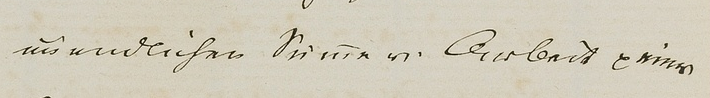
unendlichen Summe v. Arbeit & einer
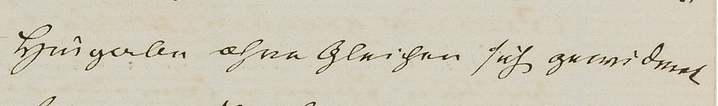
Hingabe ohne Gleichen sich gewidmet
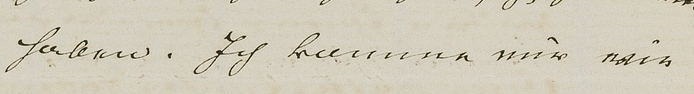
haben. Ich komme mir wie
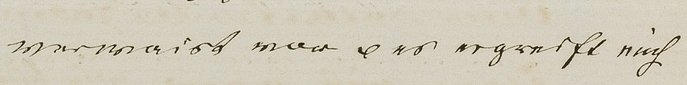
verwaist vor & es ergreift mich
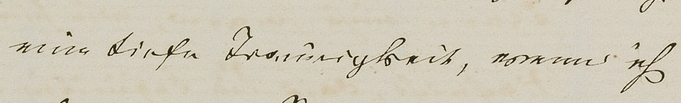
eine tiefe Traurigkeit, wenn ich
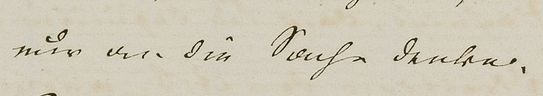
nur an die Sache denke.
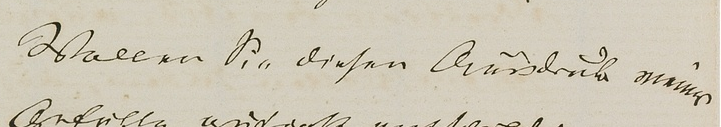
Wollen Sie diesen Ausdruk meiner
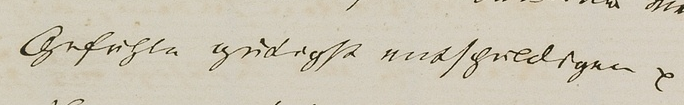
Gefühle gütigst entschuldigen &
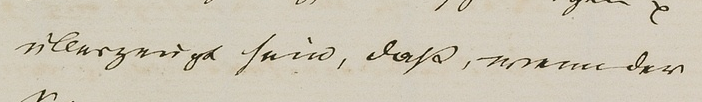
überzeugt sein, daß, wenn der
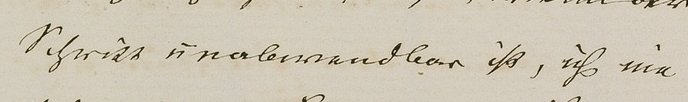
Schritt unabwendbar ist, ich nie
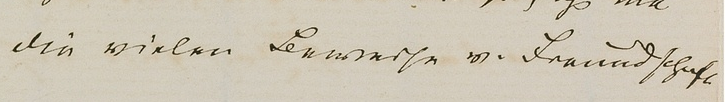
die vielen Beweise v. Freundschaft
